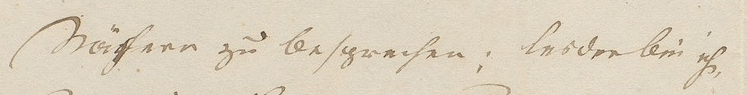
Nähern zu besprechen; leider bin ich,
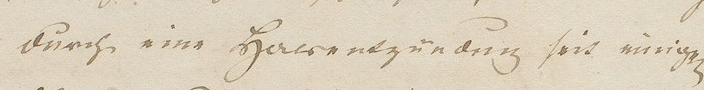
durch eine Halsentzündung seit einigen
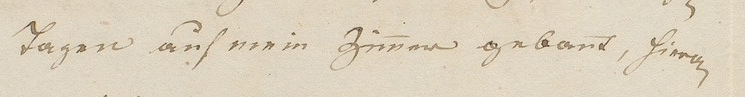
Tagen auf mein Zimmer gebannt, hieran
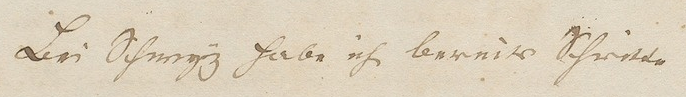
Bei Schwyz habe ich bereits Schritte
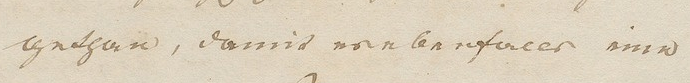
gethan, damit es ebenfalls eine
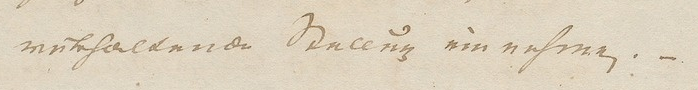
rükhaltende Stellung einnehme. –
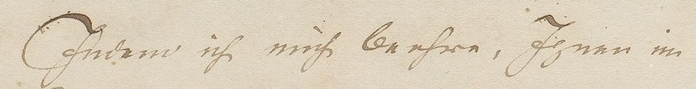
Indem ich mich beehre, Ihnen im
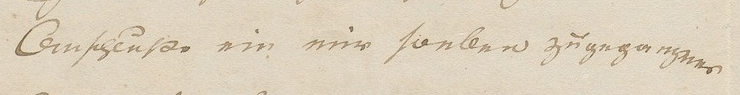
Anschluße ein mir soeben zugegangenes
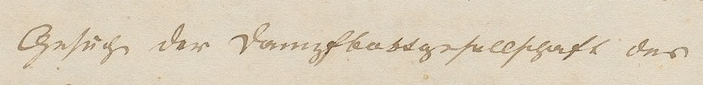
Gesuch der Dampfbootgesellschaft des
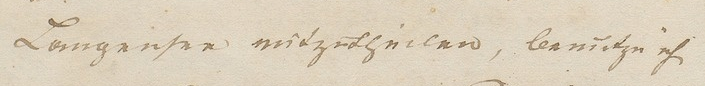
Langensee mitzuteilen, benutze ich
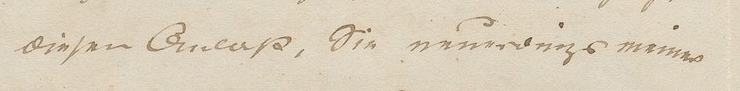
diesen Anlaß, Sie neuerdings meiner
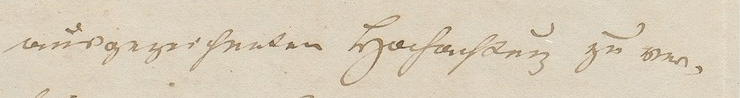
ausgezeichneten Hochachtung zu ver-
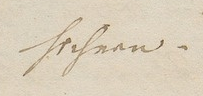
sichern.
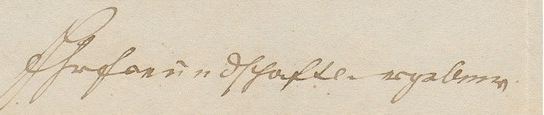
Ihr freundschaftl. ergebener
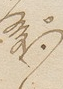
70.
